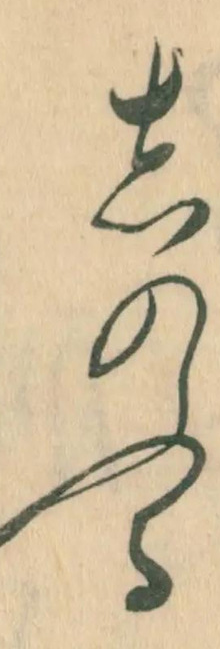しのふる

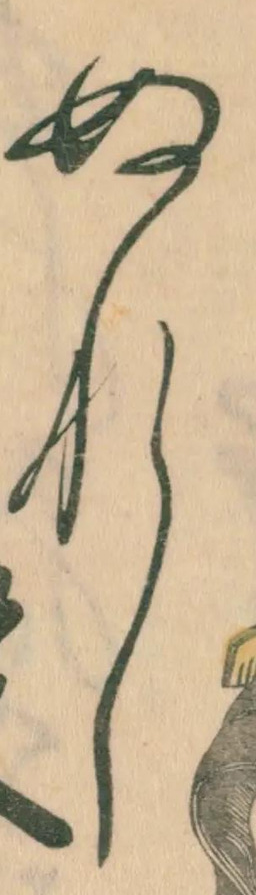ぬれし
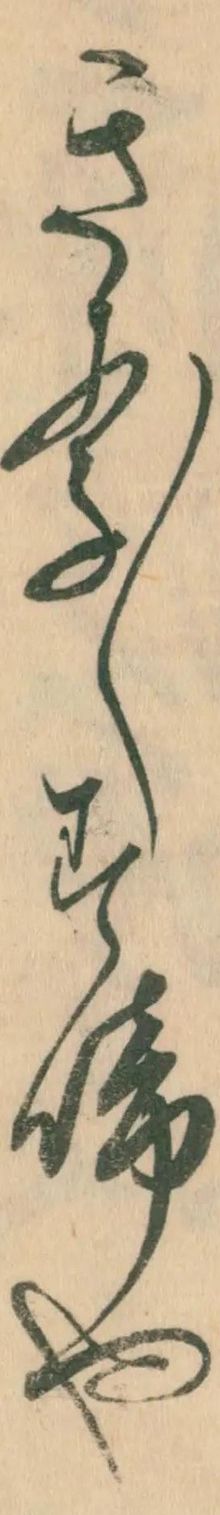きり〳〵す啼や
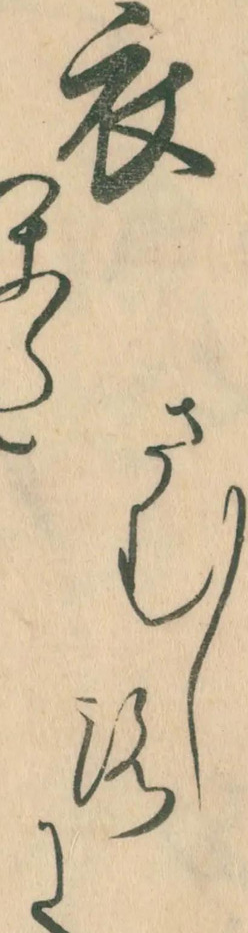衣さむしろ
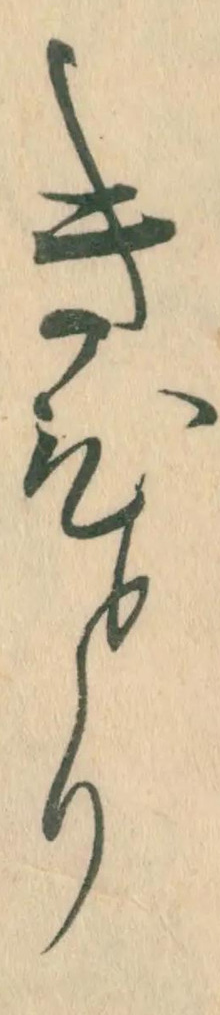きひとり
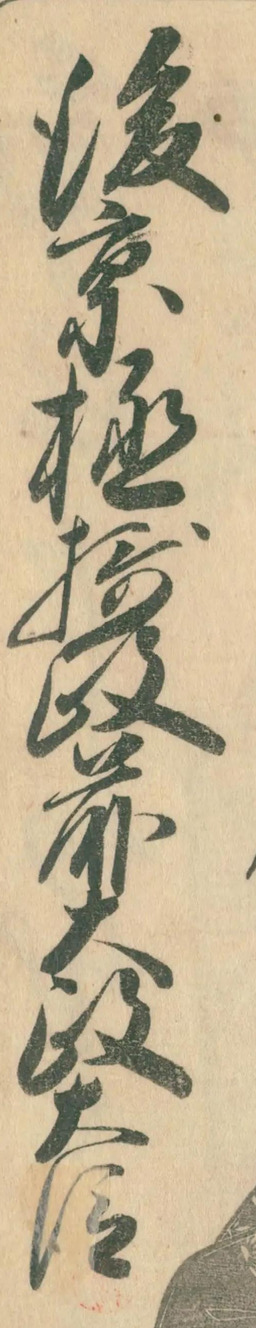後京極摂政前太政大臣

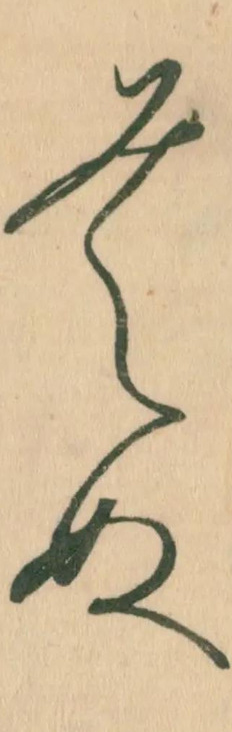みえぬ
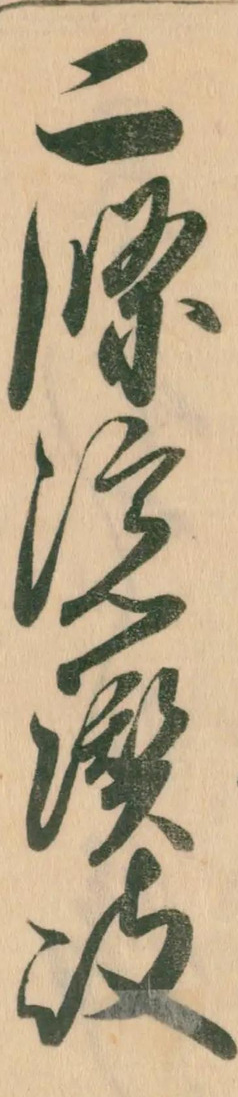二條院讃岐
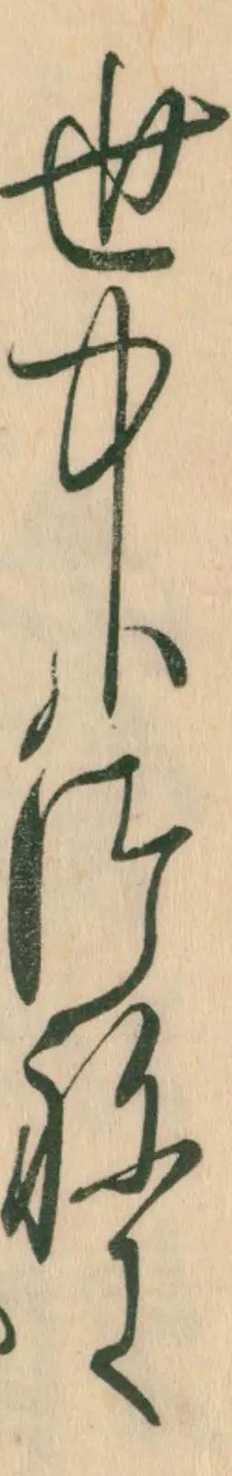世中はつねに
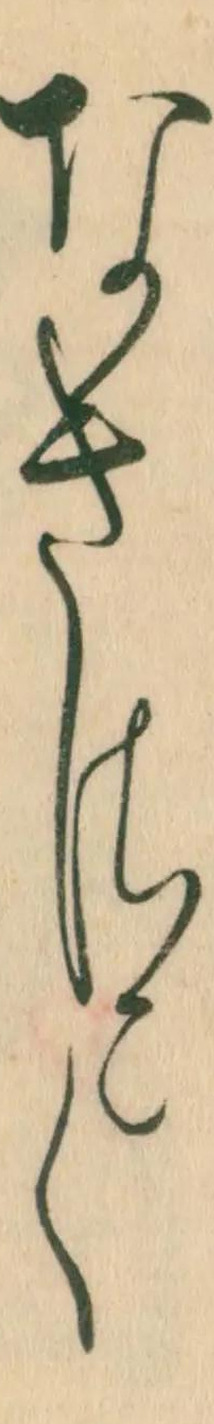なきさこく
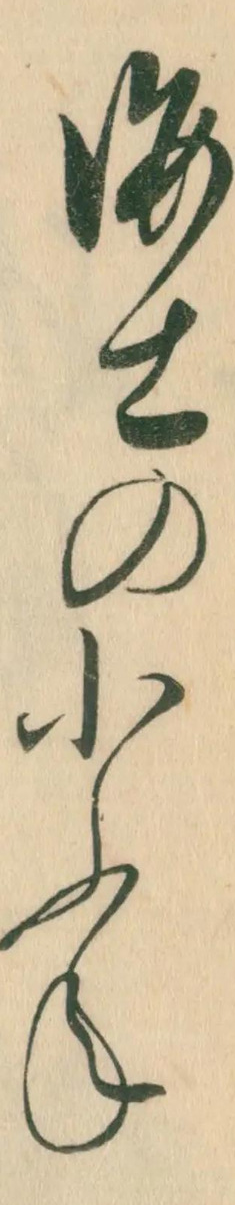海士の小ふね
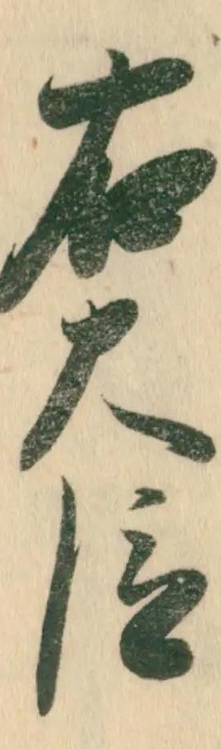右大臣

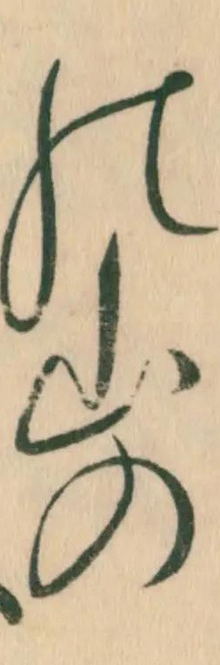の山の
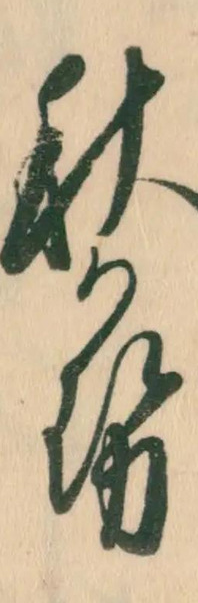秋かせ
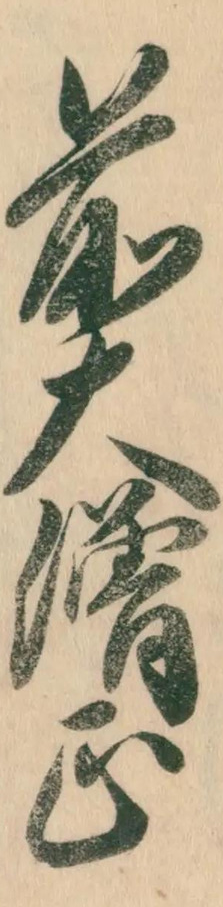前大僧正
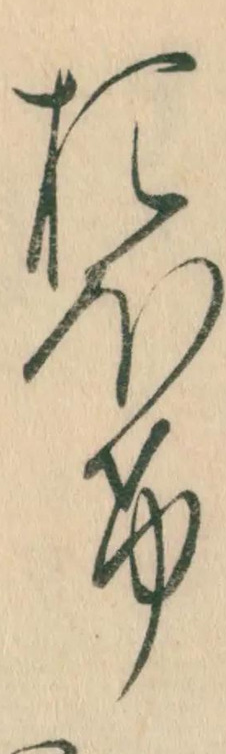おほけ
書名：錦百人一首あつま織
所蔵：国立国会図書館 National Diet Library, JAPAN
